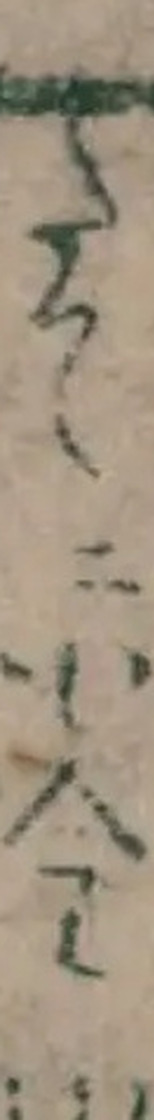たてに小金
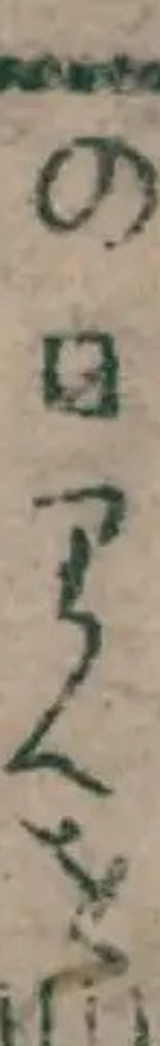の日りんを
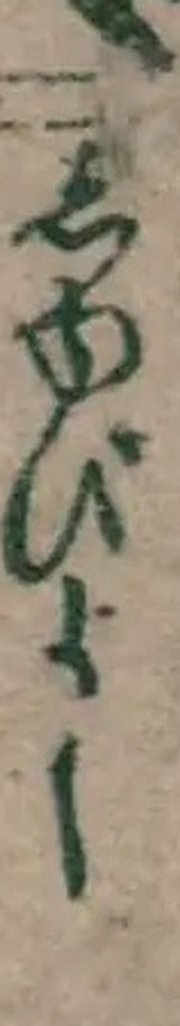しゆびよし
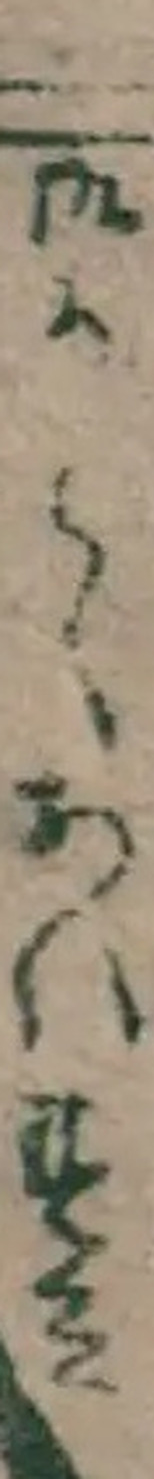御かとくあいすみ
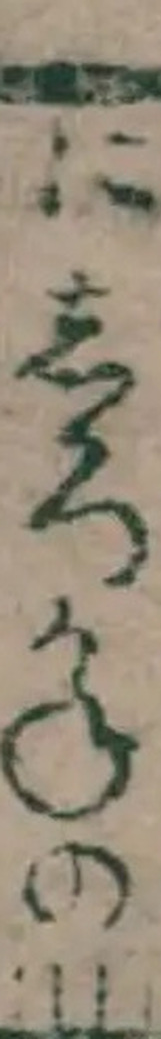にしろかねの
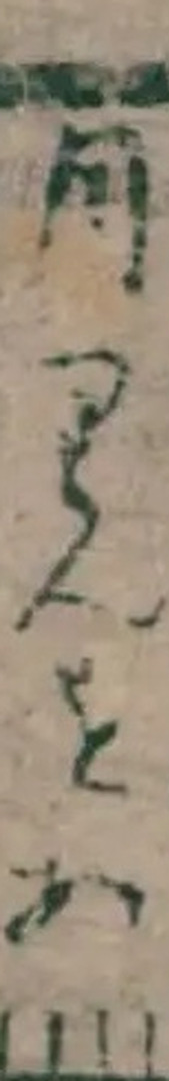月りんをあ
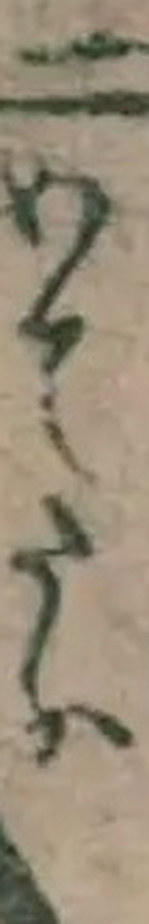めてたふ
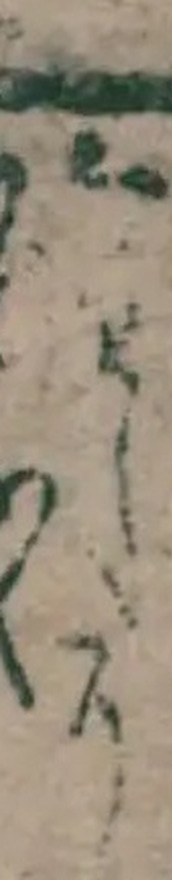らはしたり
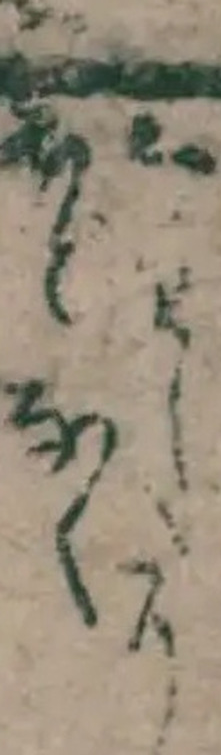ほどなく
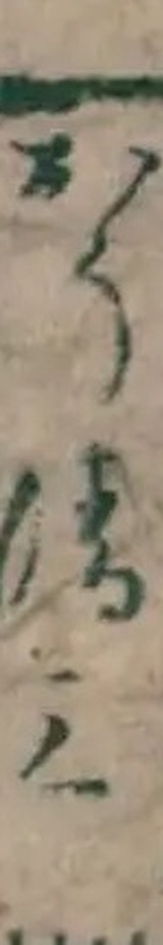かう清三
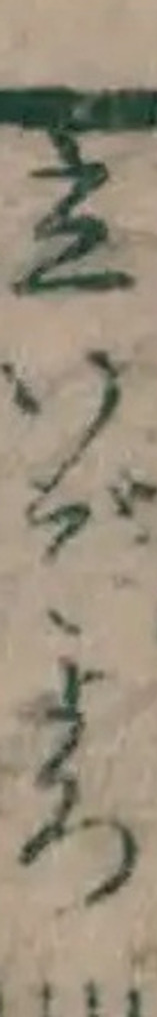立いでよろ
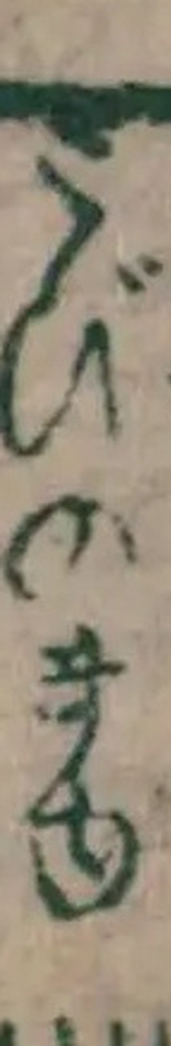こびのまゆ
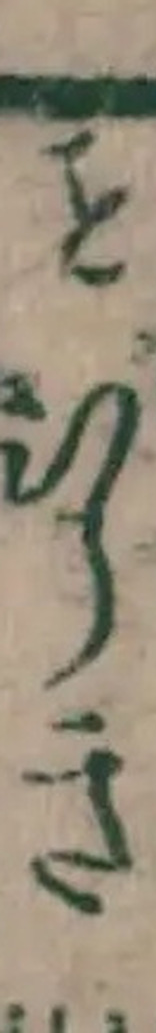をひらき
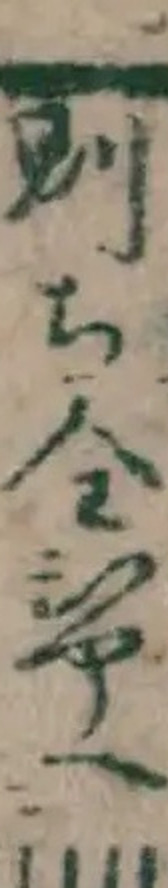則ち金ひやへ
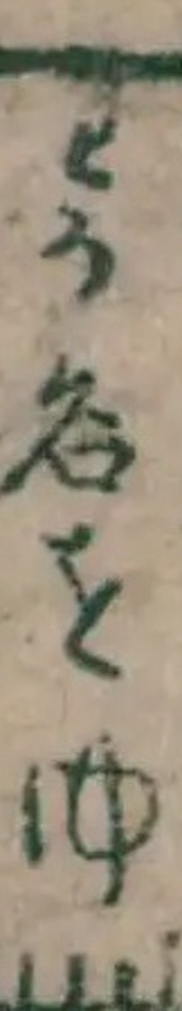わか名をゆ
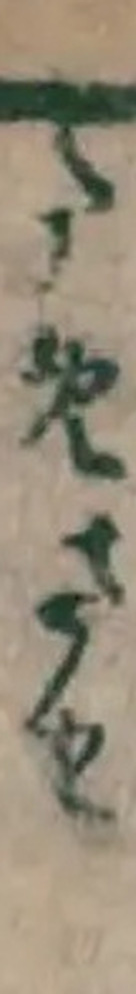ためさせ
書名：金々先生栄花夢 : 2巻
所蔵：国立国会図書館 National Diet Library, JAPAN
